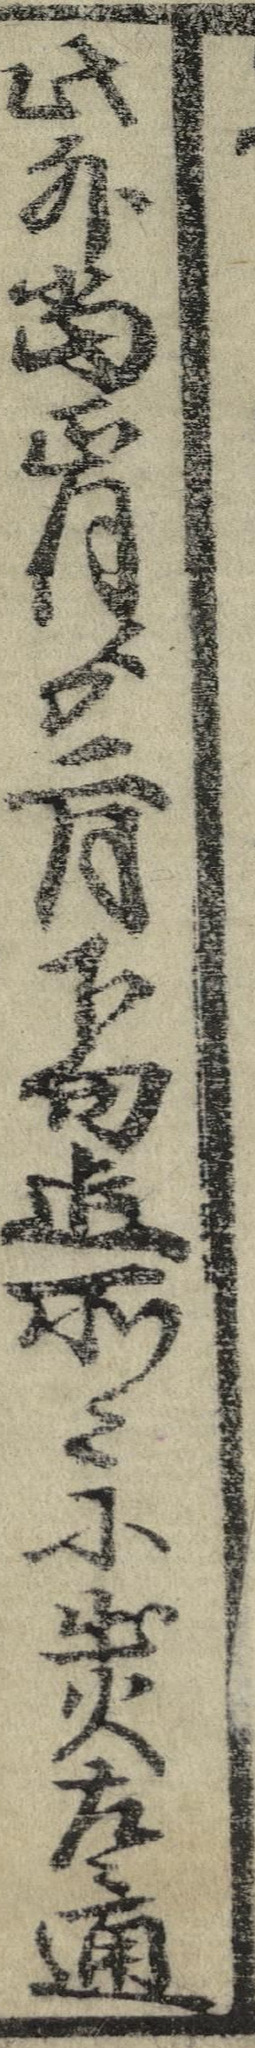此外当正月ゟ二月下旬迄所々小出火左之通
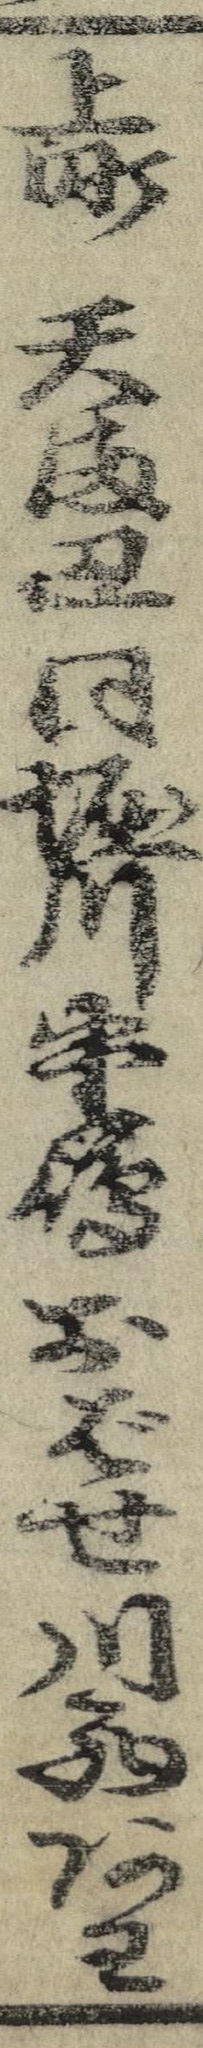上町天満辺同堀川中嶋おばせ川西あわ
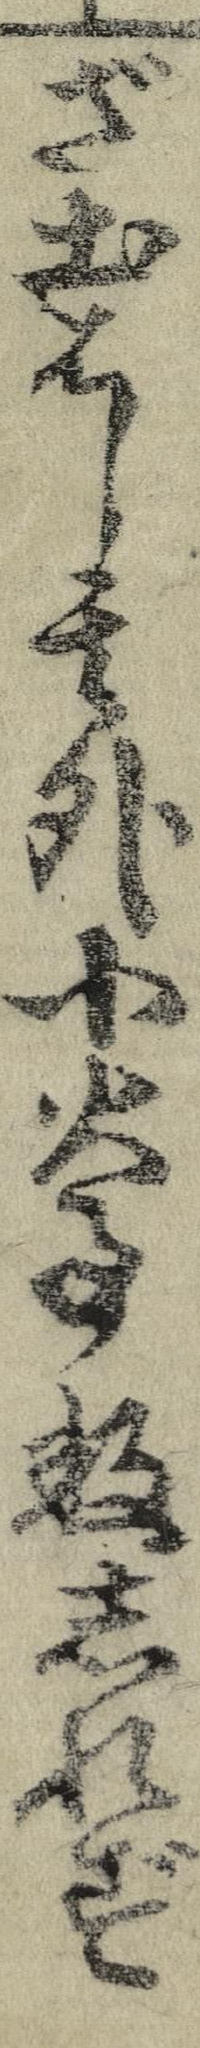ざ土はし其外小火事数しれず
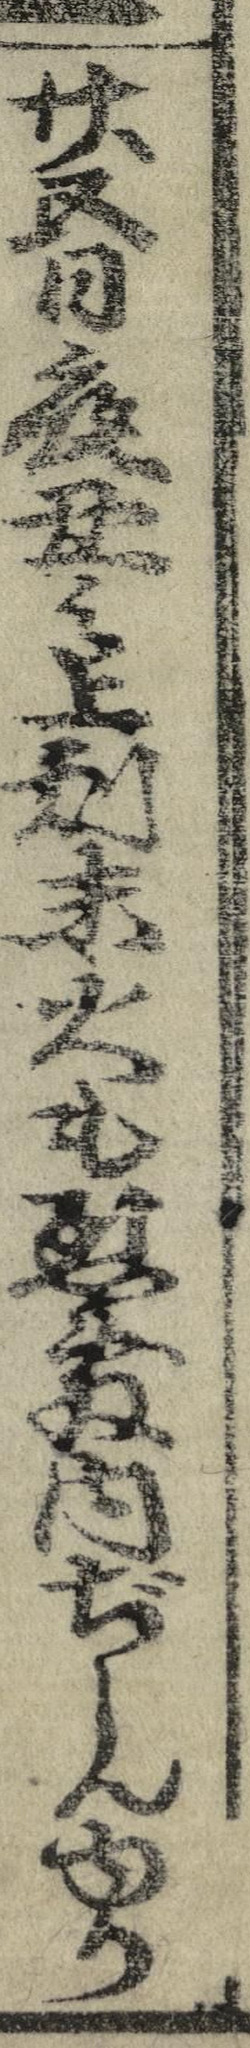廿五日夜丑之上刻未火も致敷内ぢしんゆり
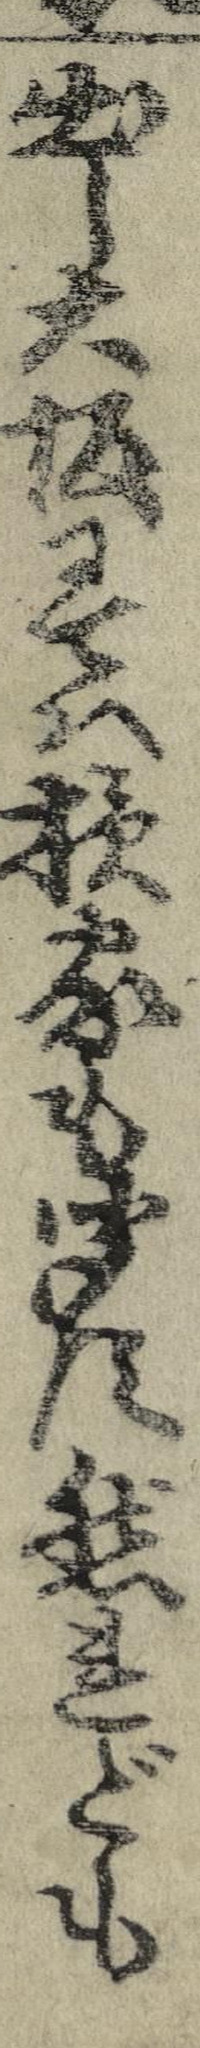出し大坂にては損家も聞す然れども
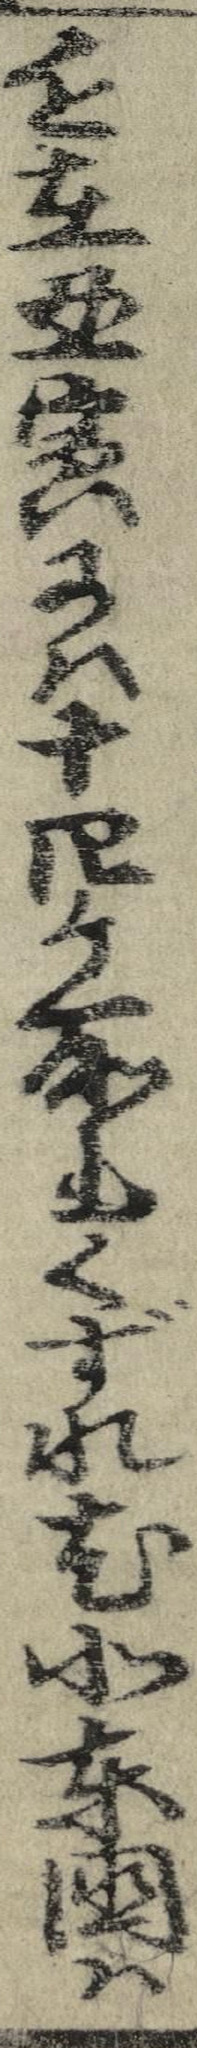近在丑寅には十四ケ所もくずれ尤北東国は
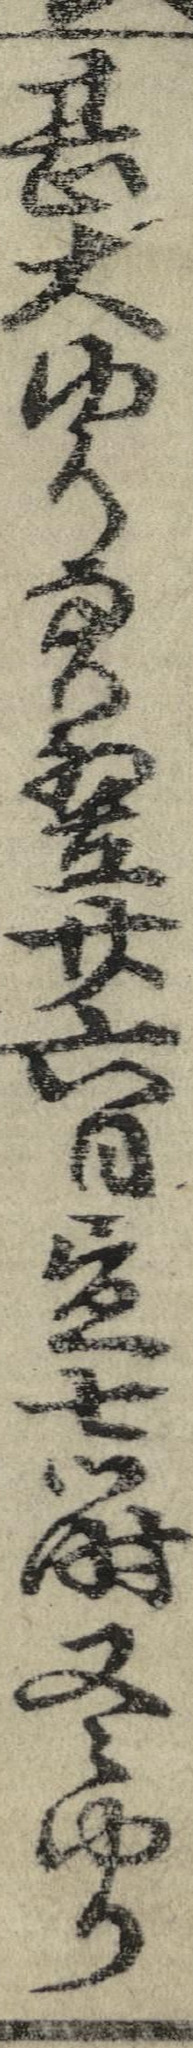甚大ゆりなり翌廿六日昼七ツ時又々ゆり
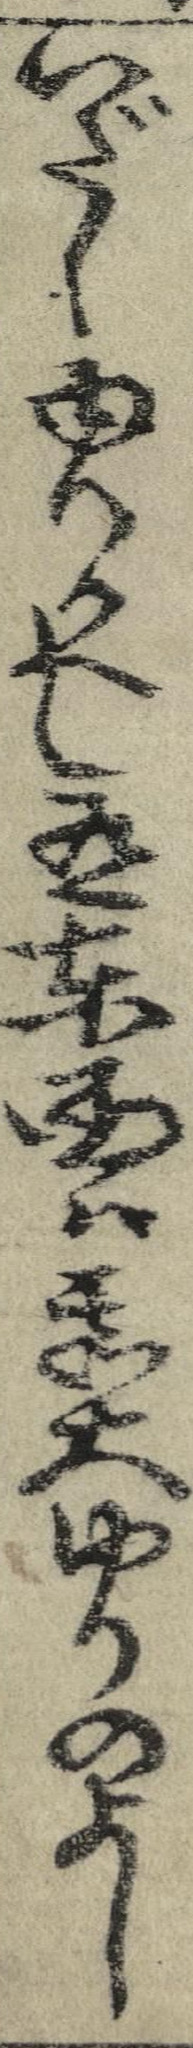いだしゆりかへし有東国は甚大ゆりのよし
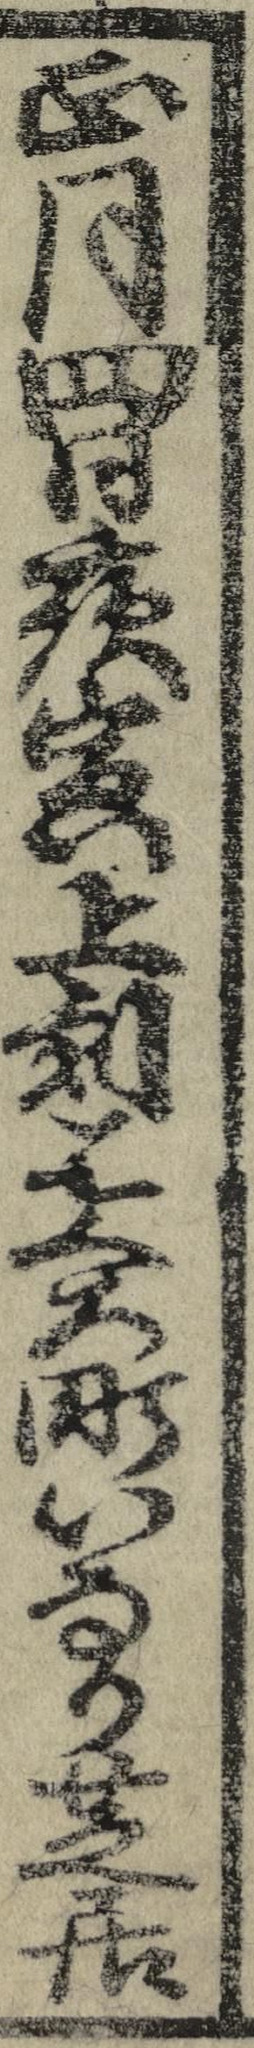正月四日夜寅上刻はくろ町いなり芝居
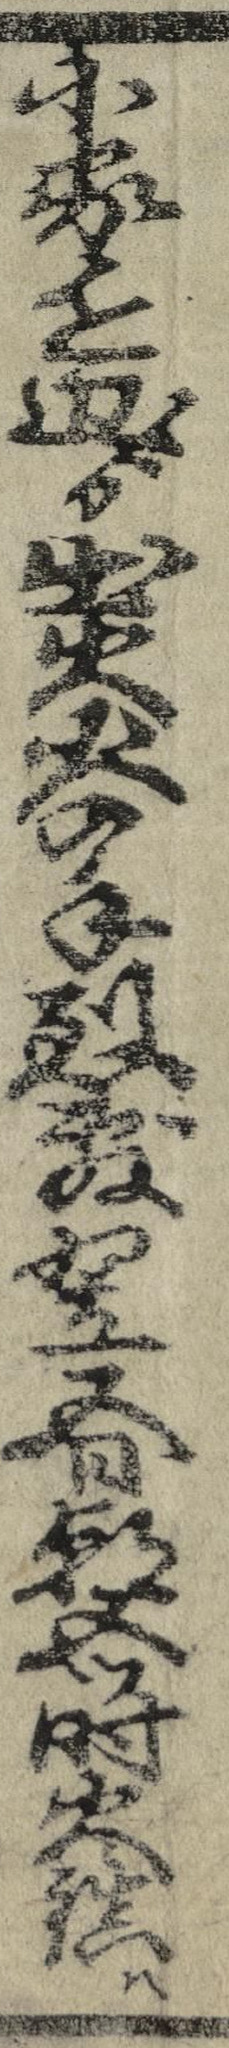小や近辺ゟ出火火の手烈敷翌五日朝五ツ時火鎮ル
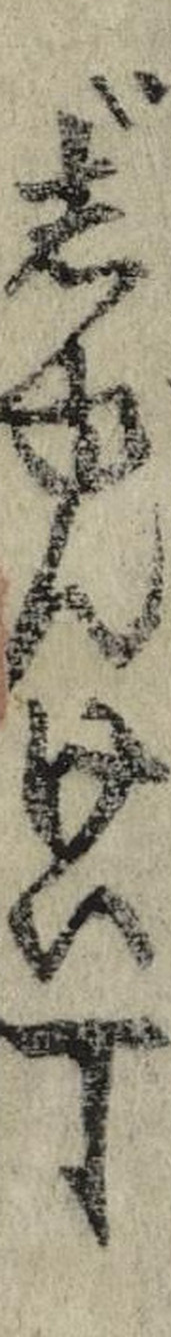じゆんけい丁
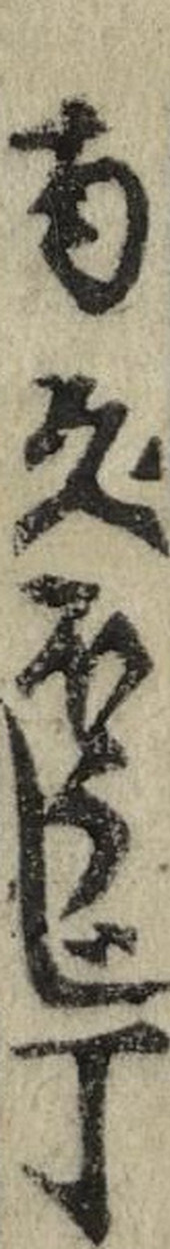南久ほうじ丁
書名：聞書　細見大阪大火図
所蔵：東京大学地震研究所図書室 Earthquake Research Institute Library, The University of Tokyo, JAPAN
